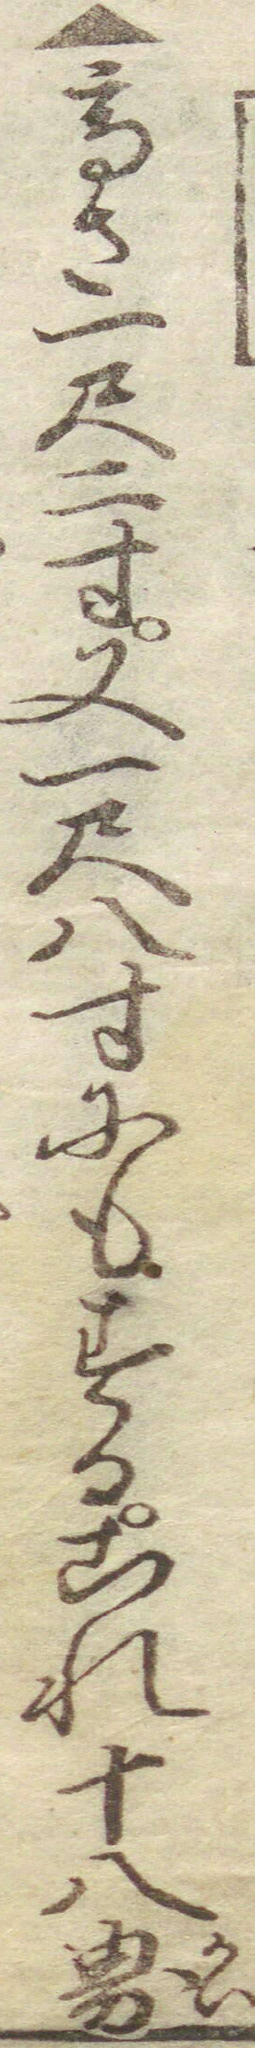▲高さ一尺二寸。又一尺八寸にもする。これ十八界
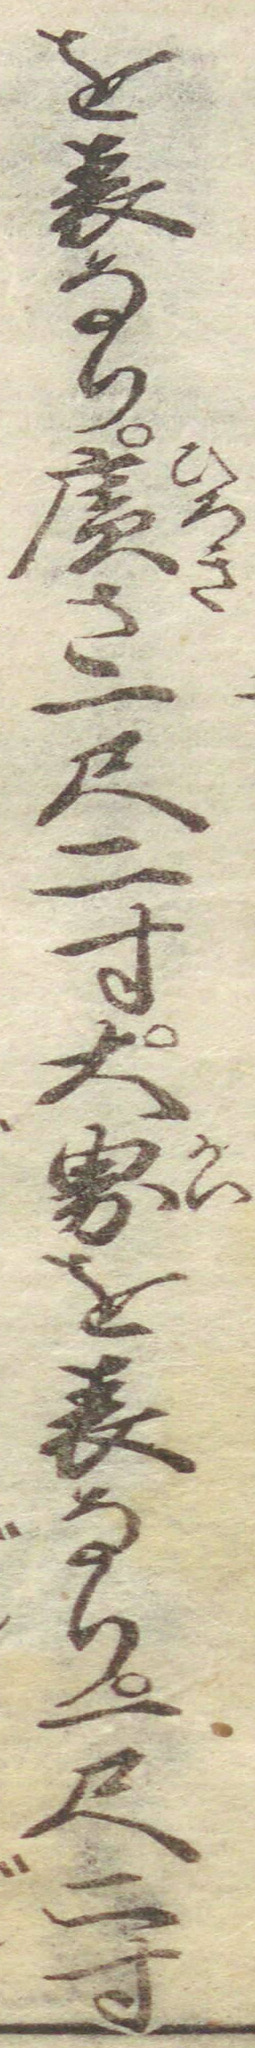を表なり。広さ一尺二寸。大界を表なり。一尺二寸
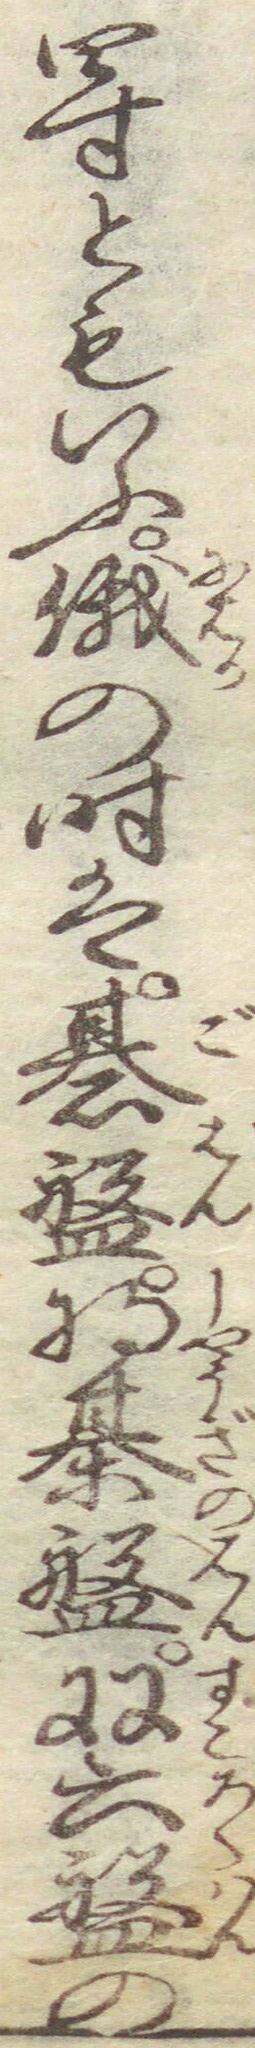四寸ともいふ。俄の時は。碁盤。将棊盤。双六盤の
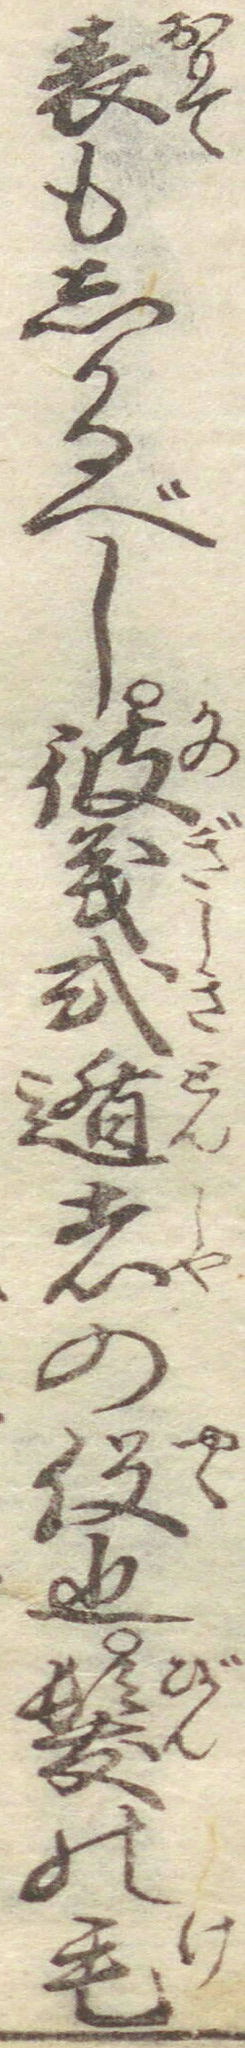表もしかるべし。彼義式遁者の役也。髪の毛
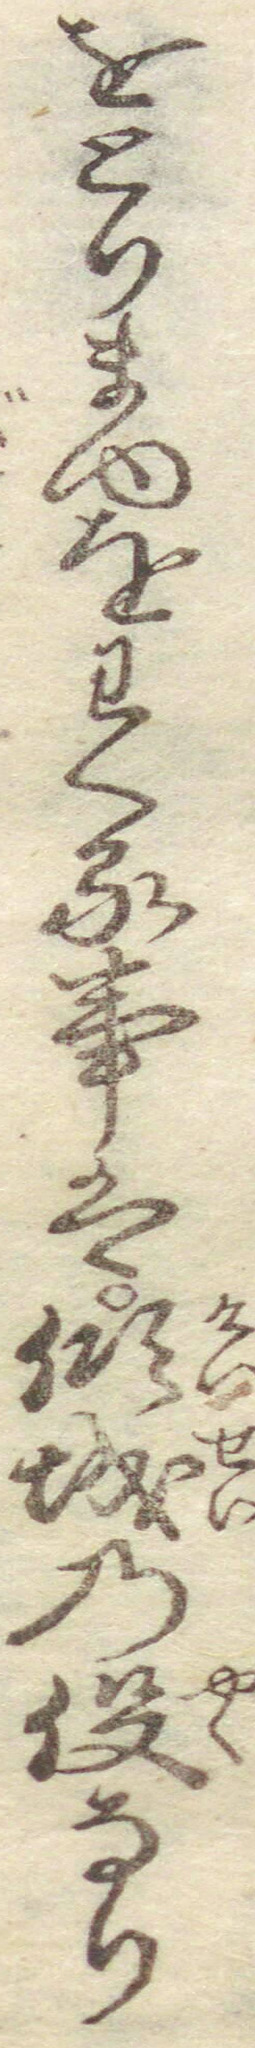をとりまゆをわくる事は。傾城の役なり
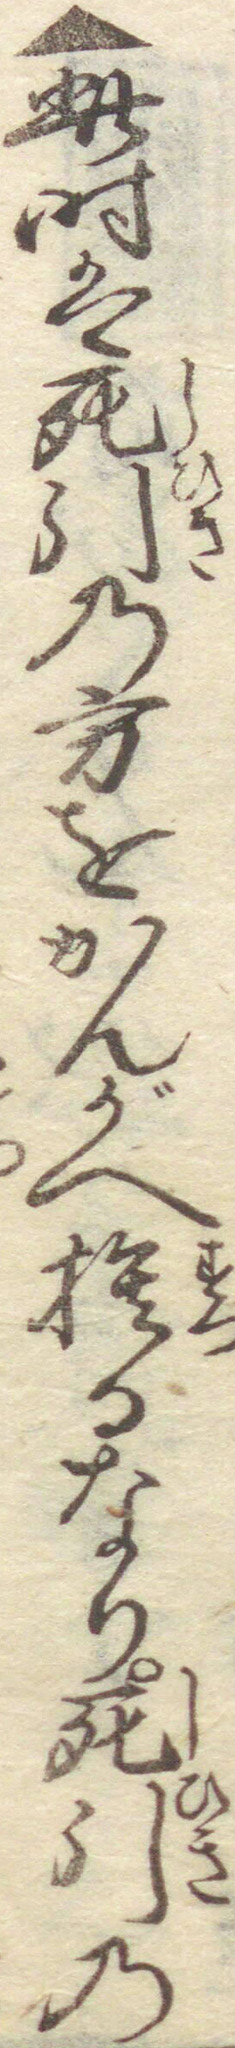▲此時は死引の方をかんがへ捨るなり。死引の
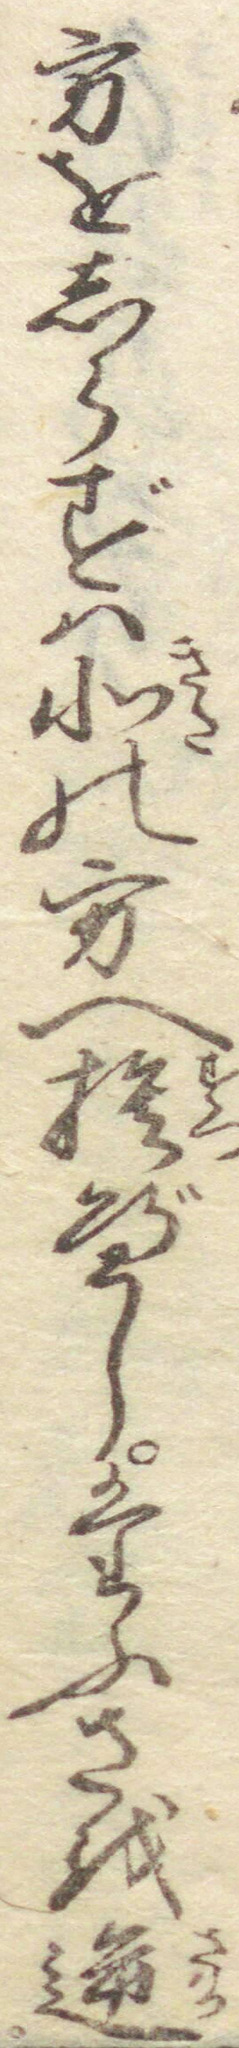方をしらずは北の方へ捨べし。たふさを逆
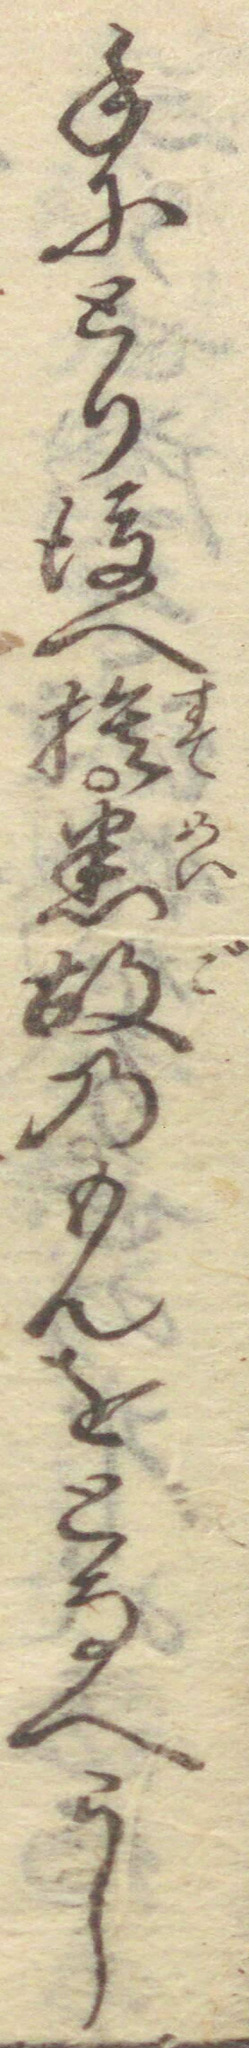手にとり後へ捨。迷故のもんをとなへうし
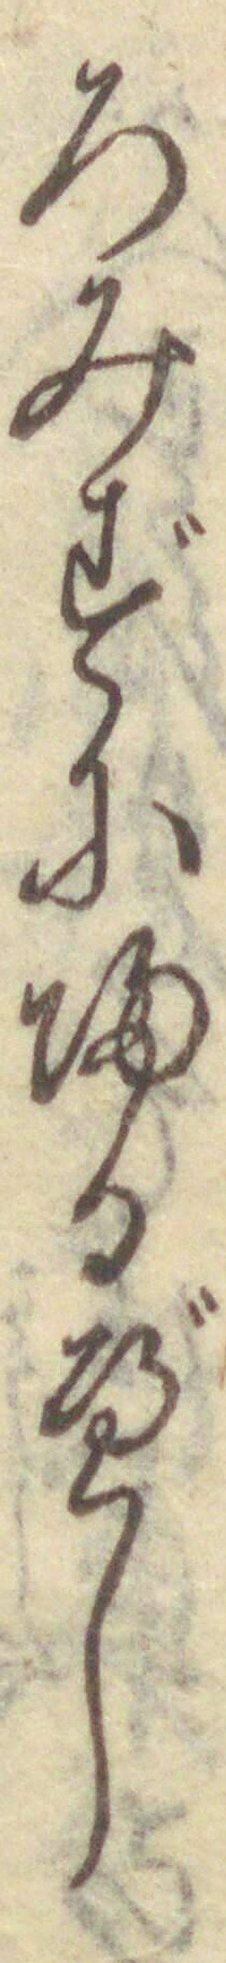ろみずに帰るべし
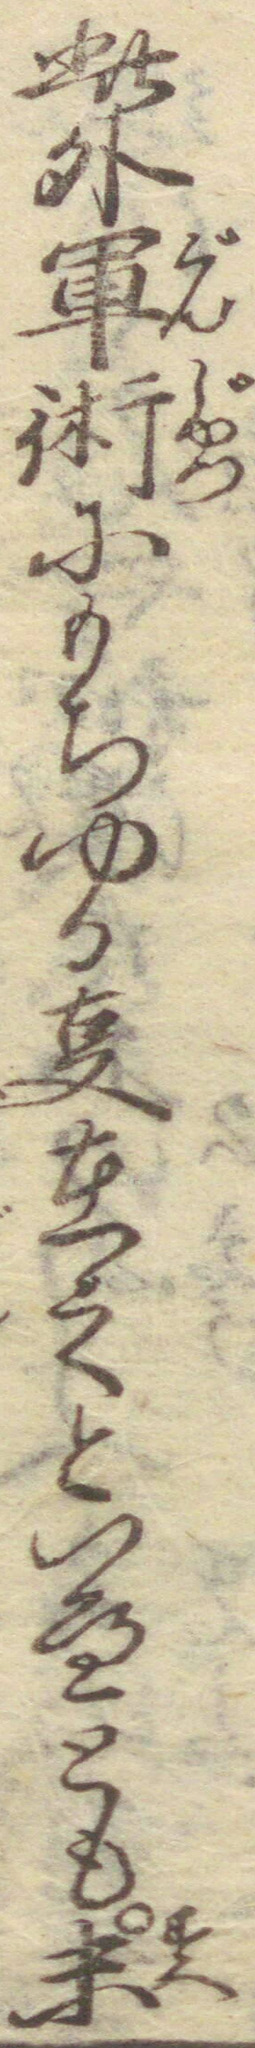此外軍術にもちゆる事在之といへとも。末
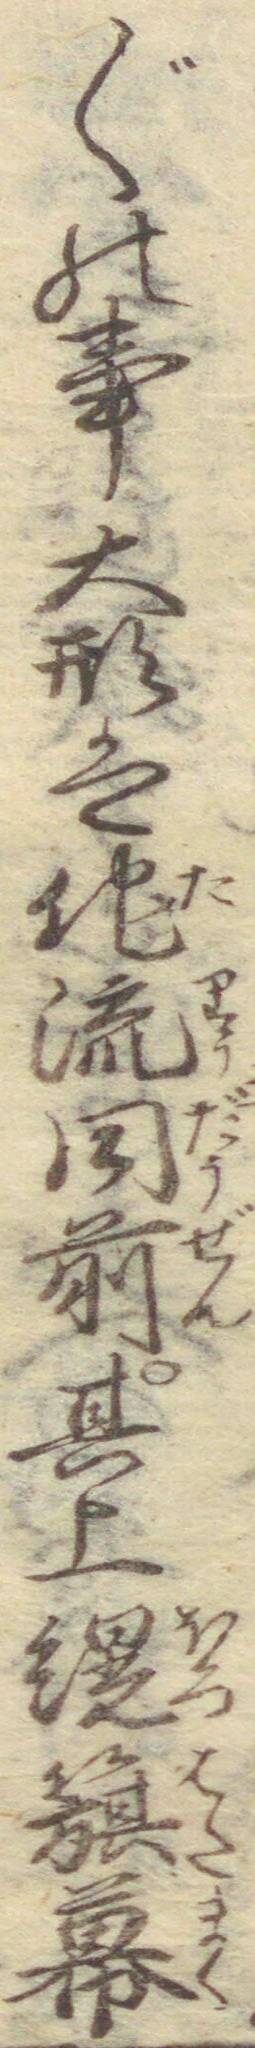〴〵の事大形は他流同前。其上縨籏幕
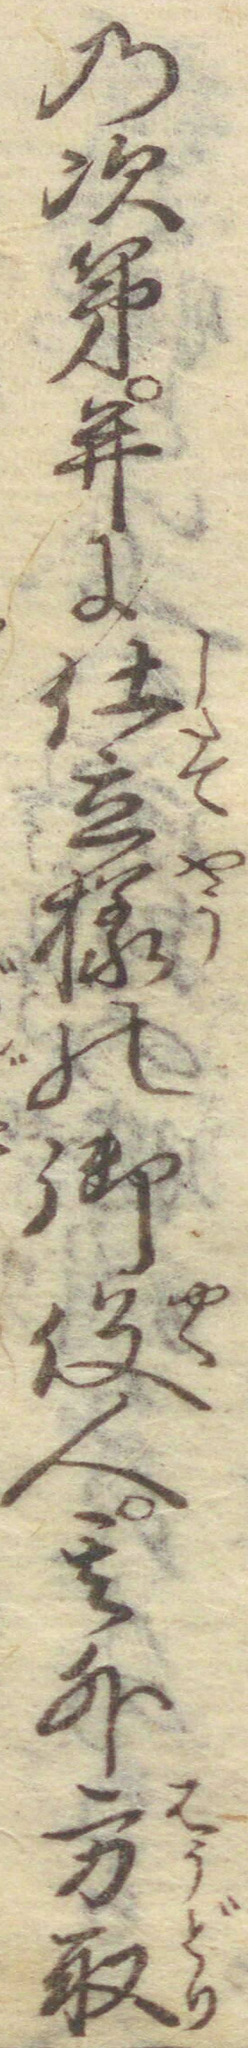の次第。幷に仕立様の御役人。其外方取
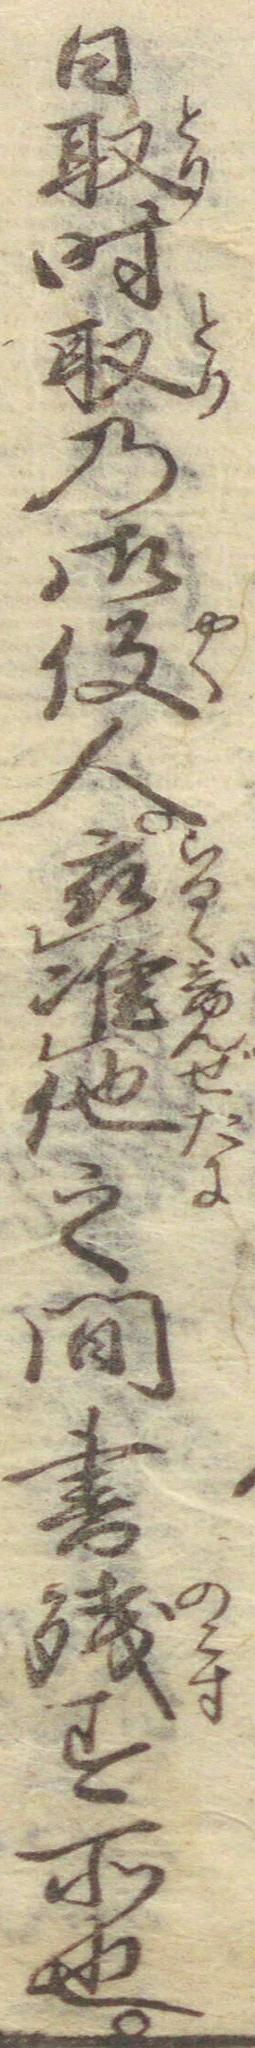日取時取の御役人。被准他之間書残す所也。
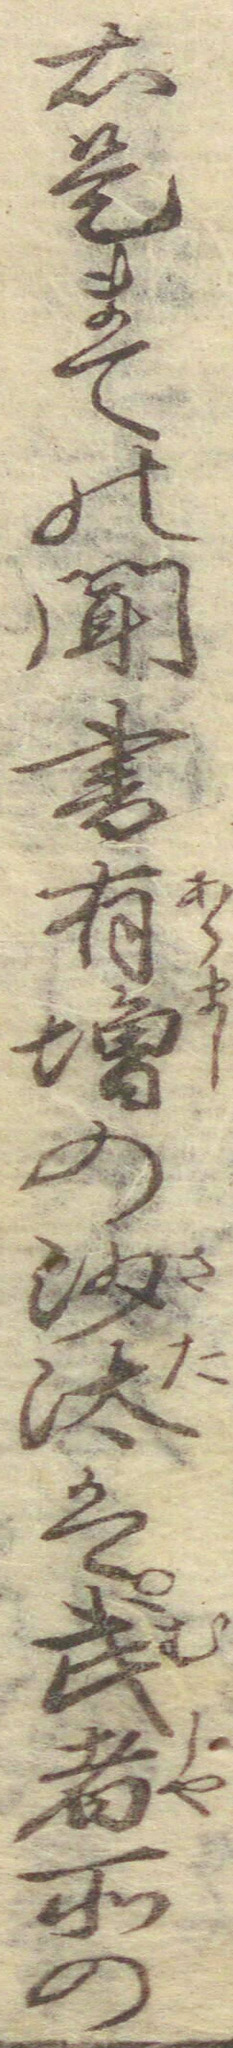右是まての聞書有増の沙汰は。武者所の
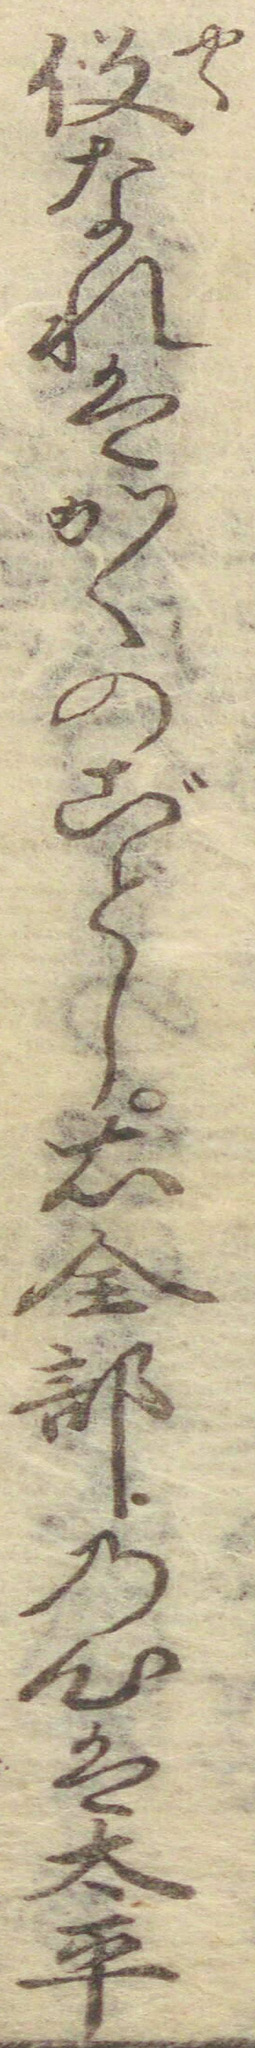役なれはかくのごとし。右全部の心は太平
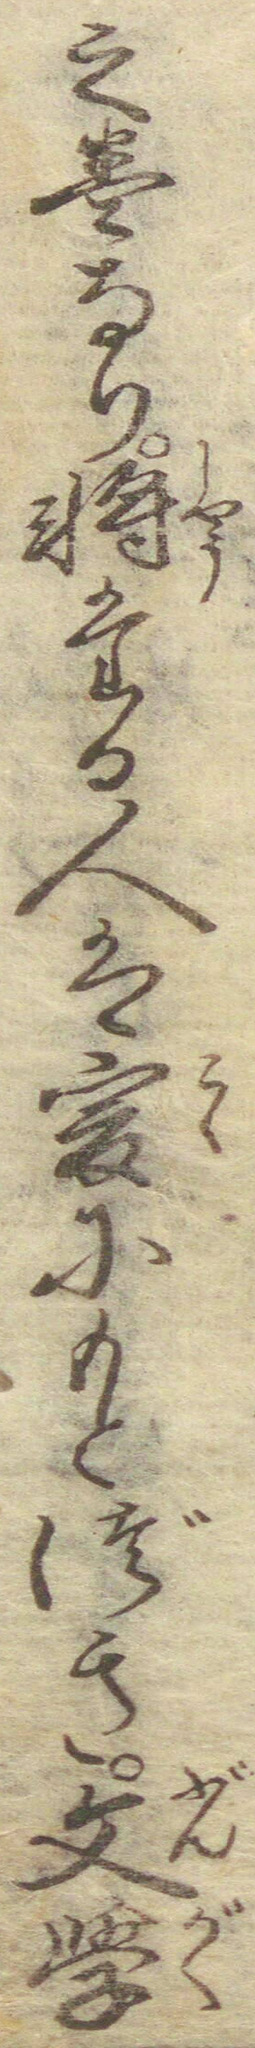之巻なり。将たる人は爰にもとづき。文学
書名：軍法極秘傳書
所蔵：国文学研究資料館
